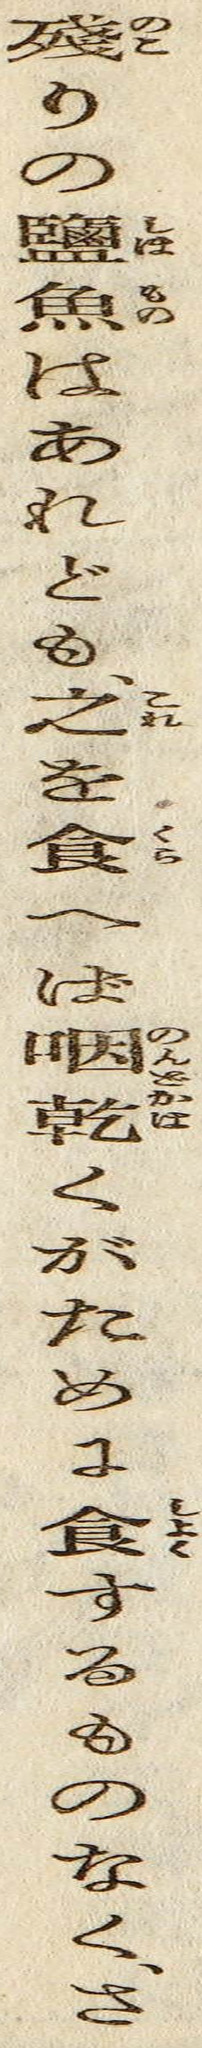残りの塩魚はあれども、之を食へば咽乾くがために食するものなく、さ
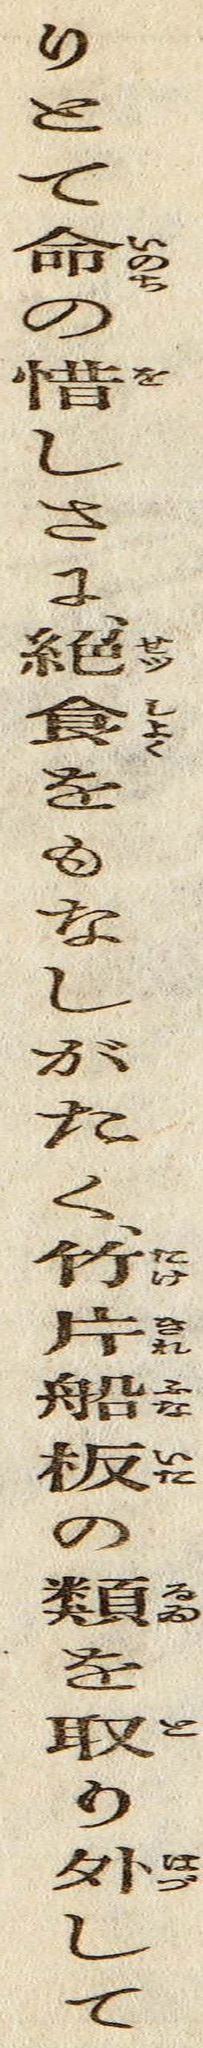りとて命の惜しさに、絶食をもなしがたく、竹片船板の類を取り外して
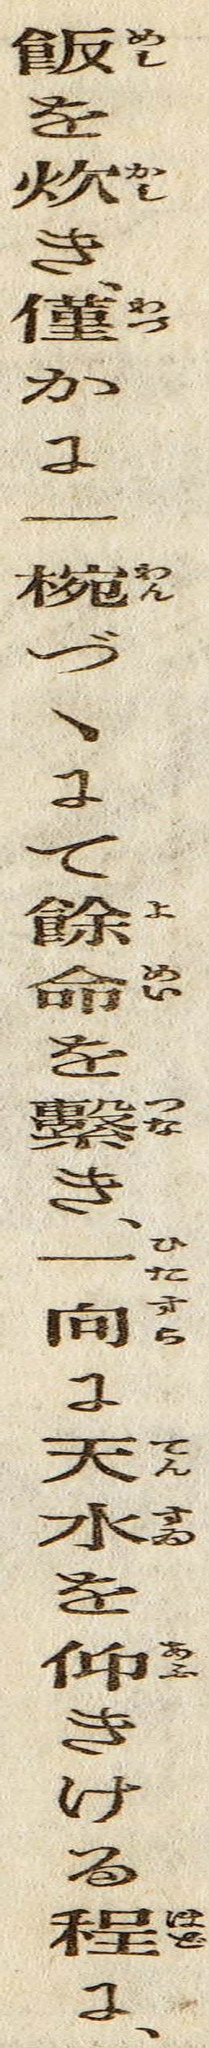飯を炊き、僅かに一椀づゝにて余命を繋き、一向に天水を仰きける程に、
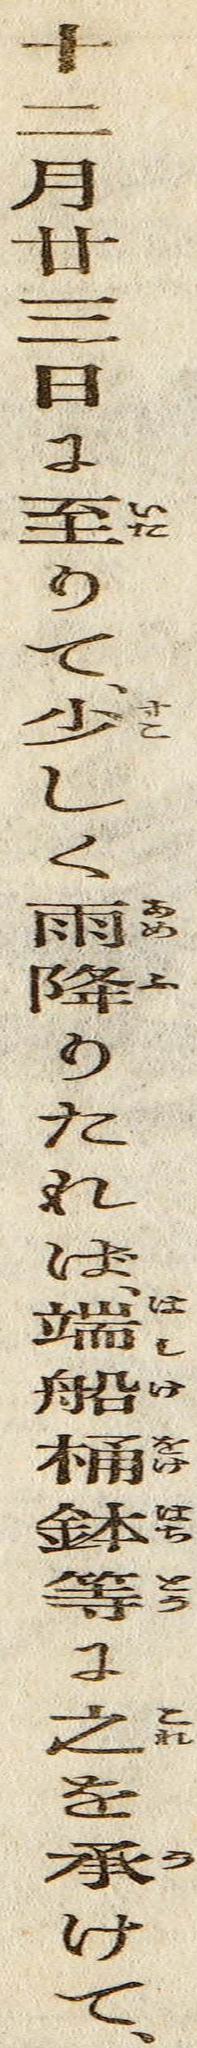十二月廿三日に至りて、少しく雨降りたれば、端船桶鉢等に之を承けて、
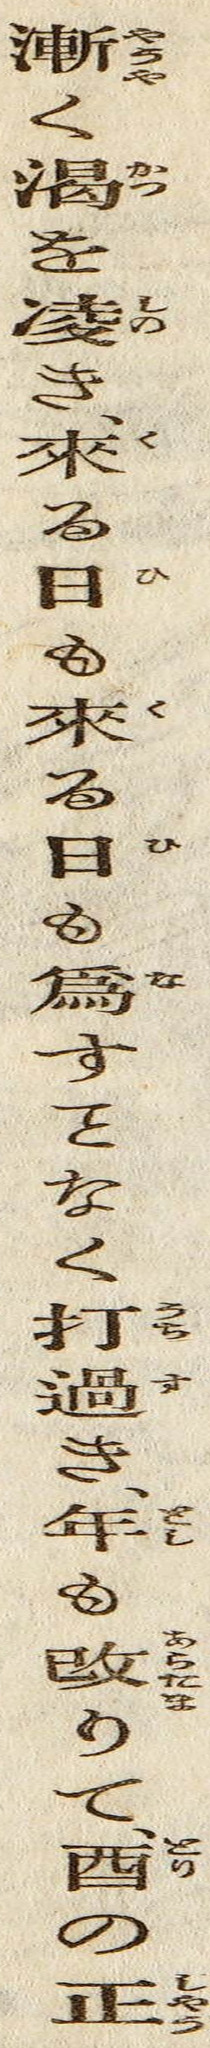漸く渇を凌き、来る日も来る日も為すことなく打過き、年も改りて、酉の正
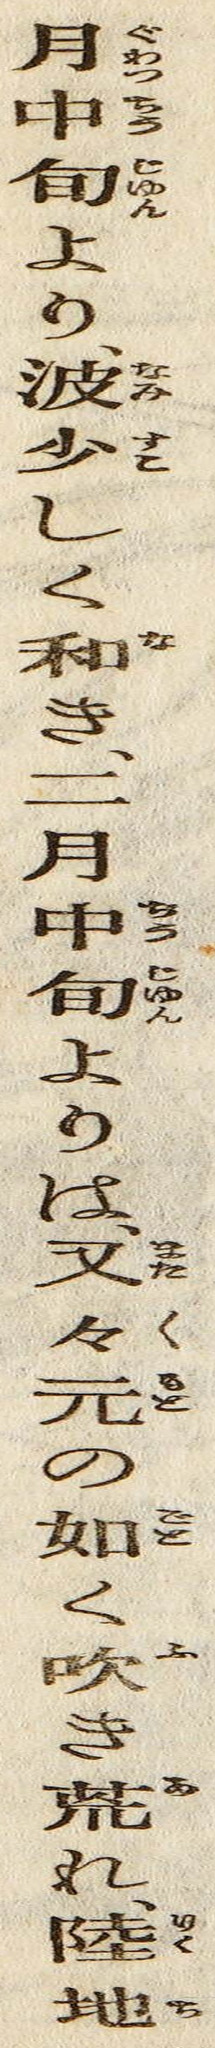月中旬より、波少しく和き、二月中旬よりは、又々元の如く吹き荒れ、陸地
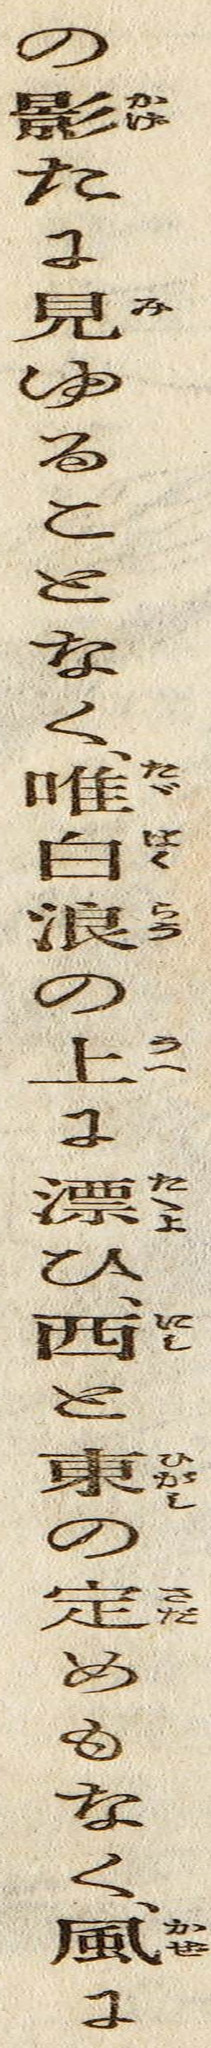の影たに見ゆることなく、唯白浪の上に漂ひ、西と東の定めもなく、風に
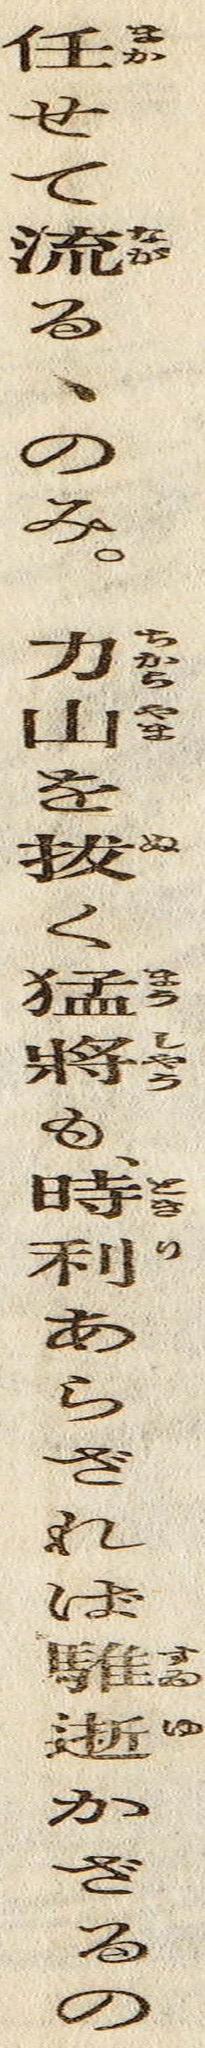任せて流るゝのみ。力山を抜く猛将も、時利あらざれば騅逝かざるの
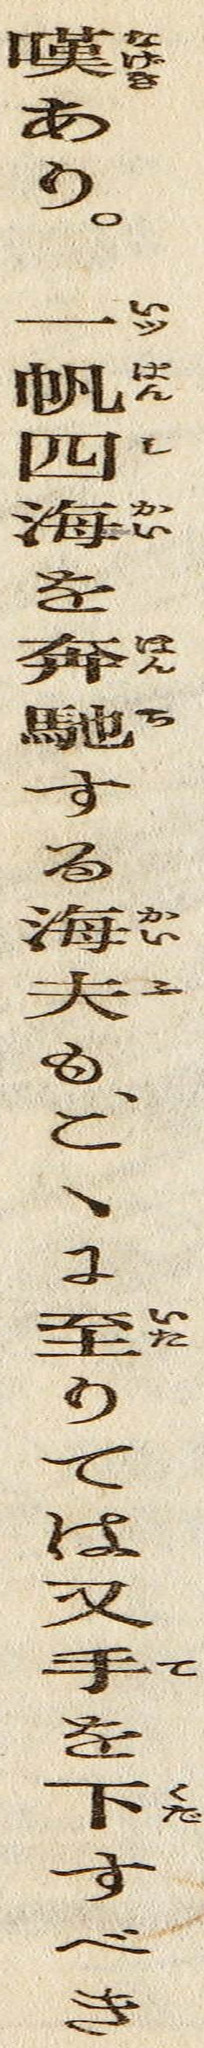嘆あり。一帆四海を奔馳する海夫も、こゝに至りては又手を下すべき
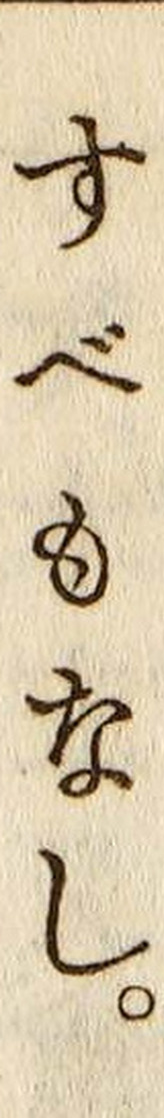すべもなし。
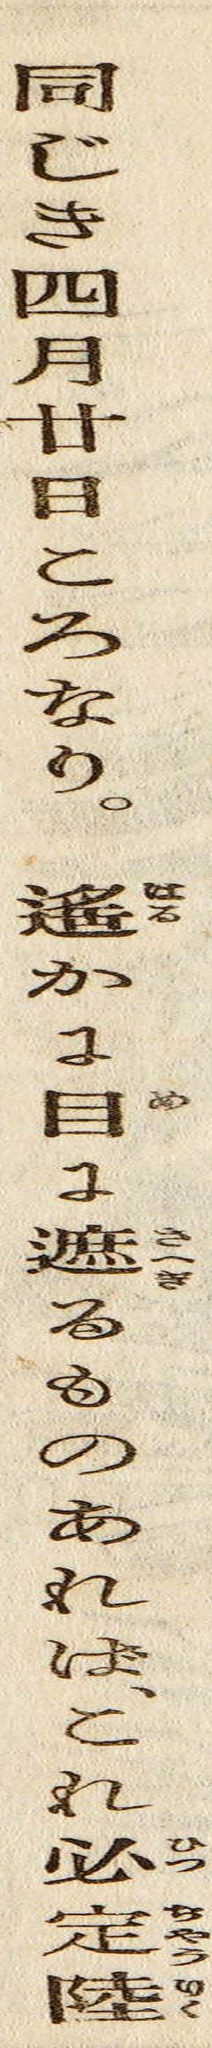同じき四月廿日ころなり。遥かに目に遮るものあれば、これ必定陸
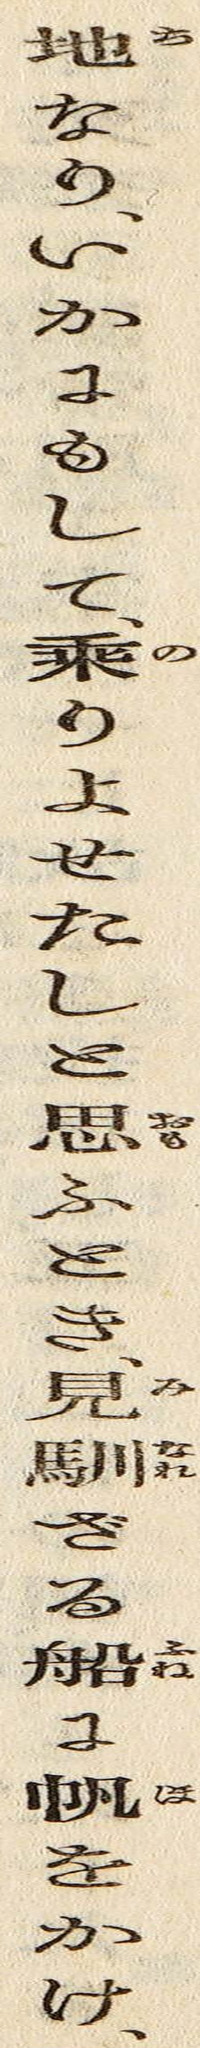地なり、いかにもして、乗りよせたしと思ふとき、見馴ざる船に帆をかけ、
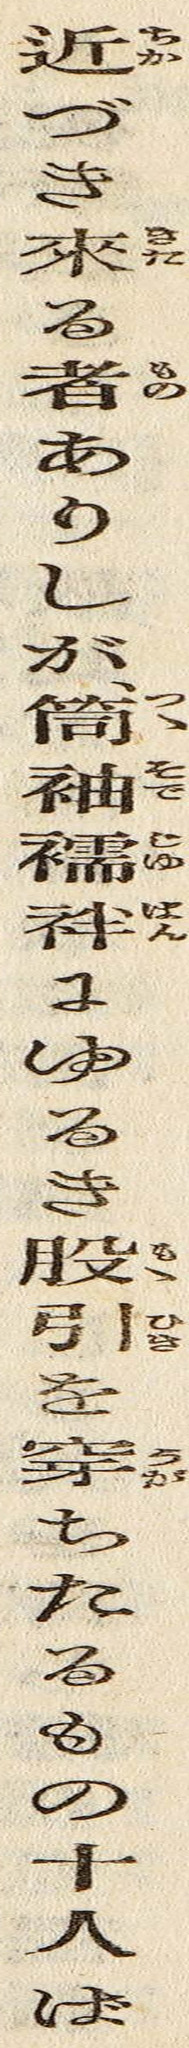近づき来る者ありしが、筒袖襦袢にゆるき股引を穿ちたるもの十人は
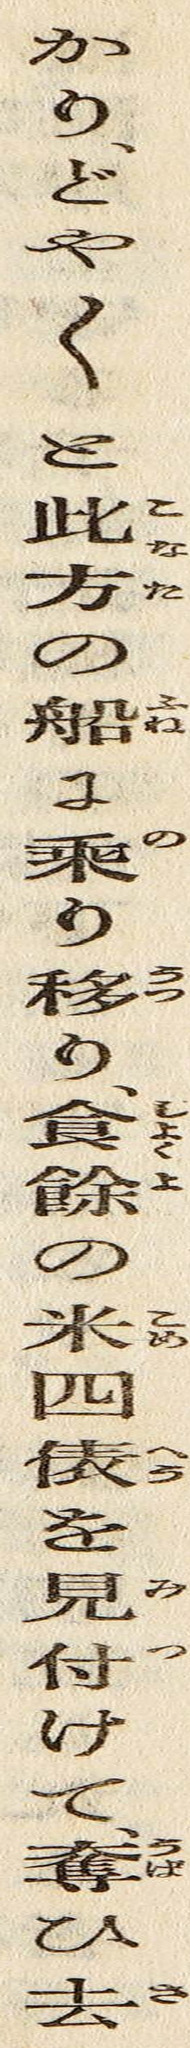かり、どや〳〵と此方の船に乗り移り、食余の米四俵を見付けて、奪ひ去
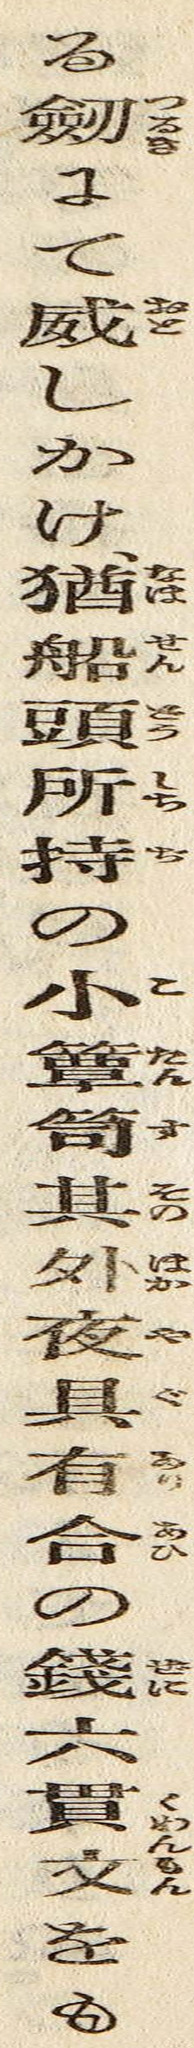る剣にて威しかけ、猶船頭所持の小箪笥其外夜具有合の六貫文をも
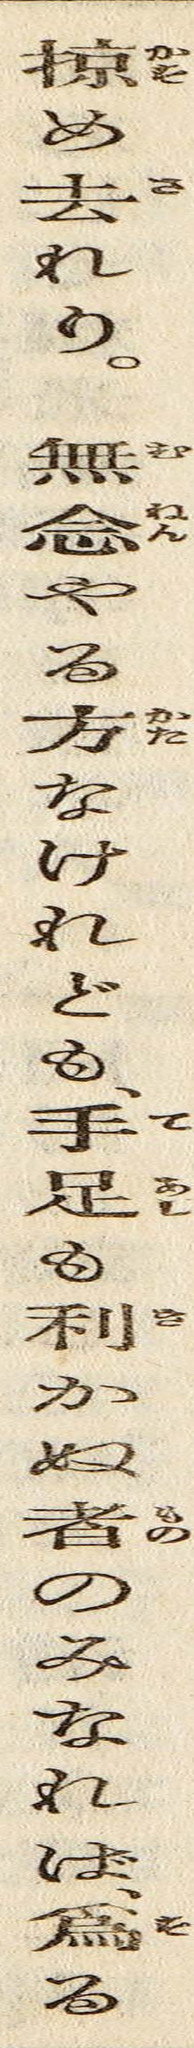掠め去れり。無念やる方なけれども、手足も利かぬ者のみなれば、為る
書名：日本漂流譚
